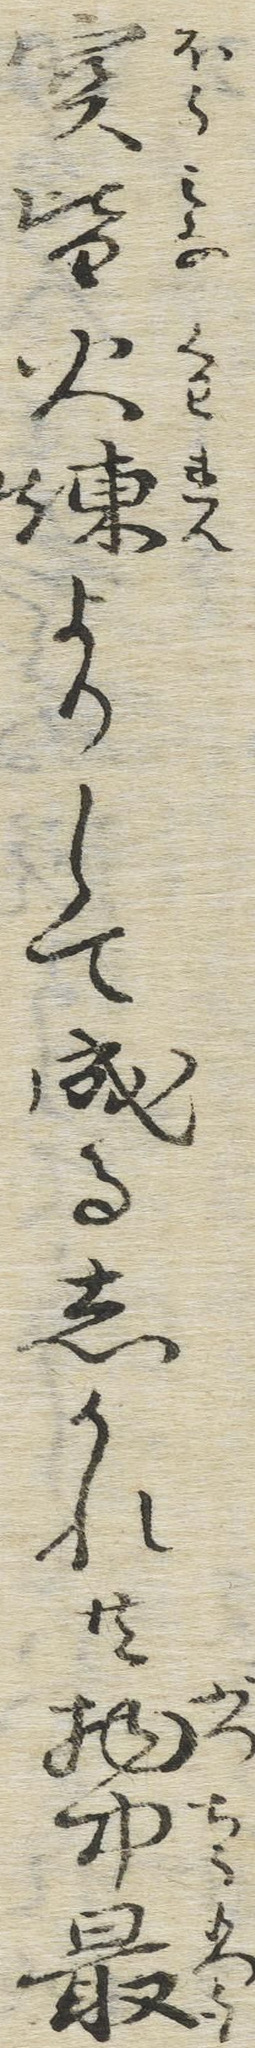宝皆火練よりして成るしかれ共物中最
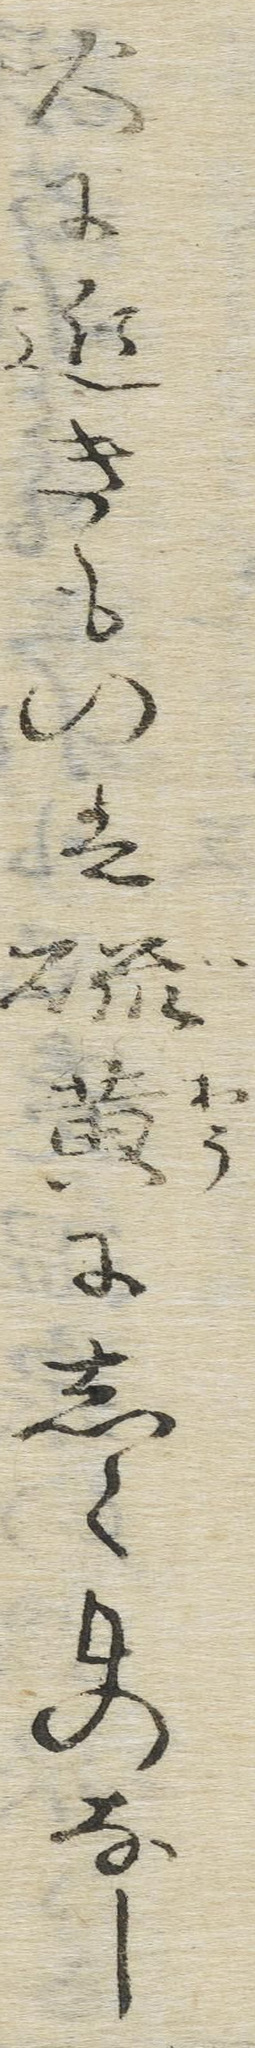火に近きものは硫黄にしくものなし
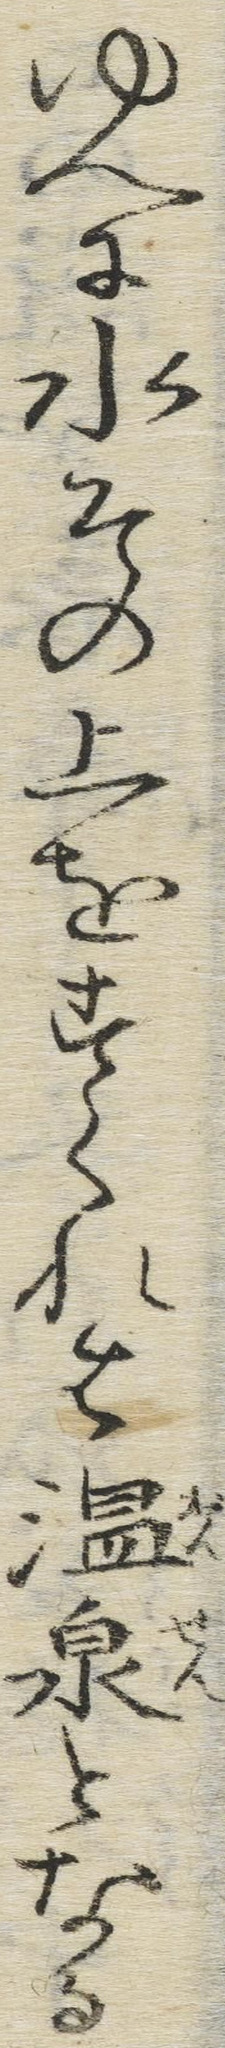ゆへに水その上をすくれは温泉となる
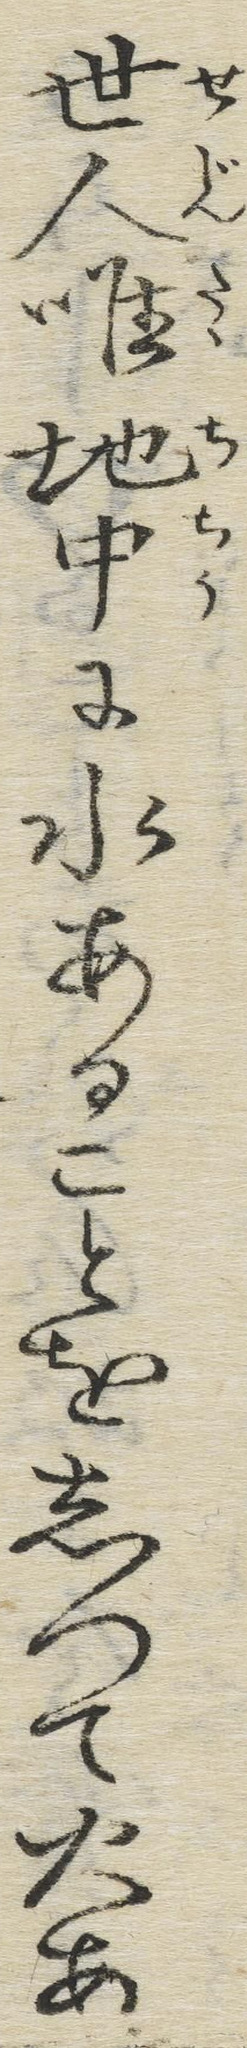世人唯地中に水あることをしつて火あ
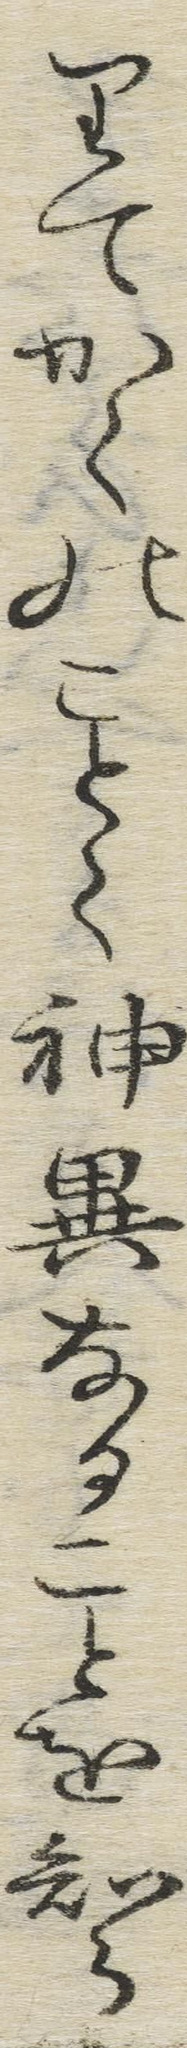りてかくのことく神異なることを知ら
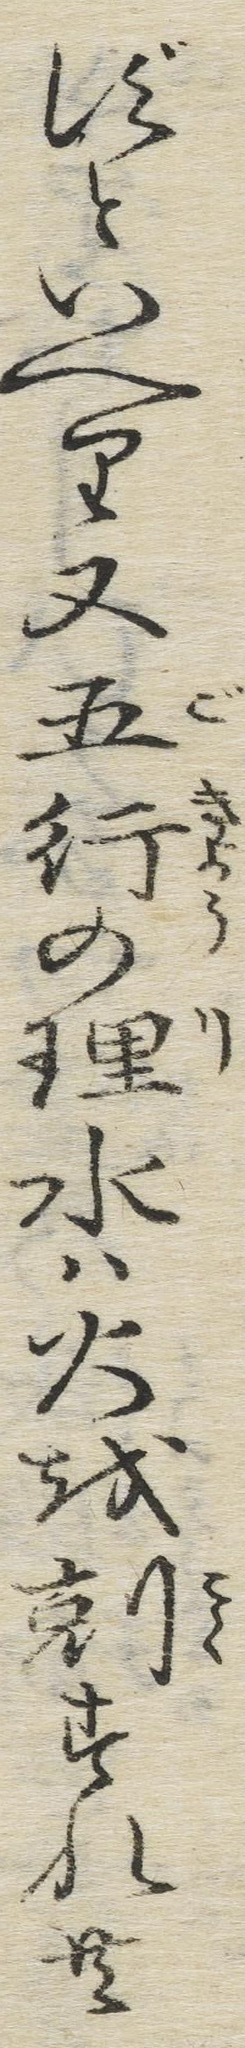ずといへり又五行の理水は火を剋すれ共
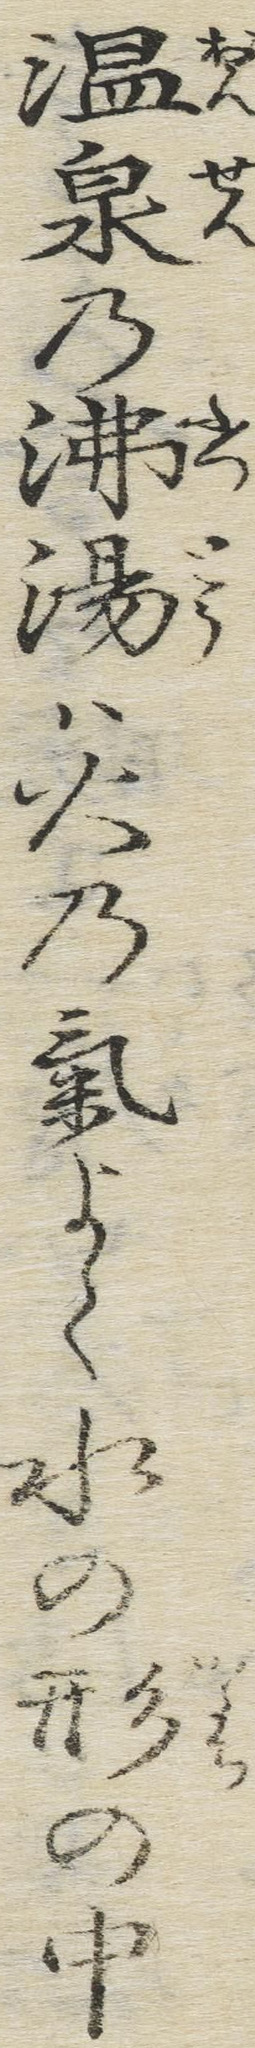温泉の沸湯は火の気よく水の形の中
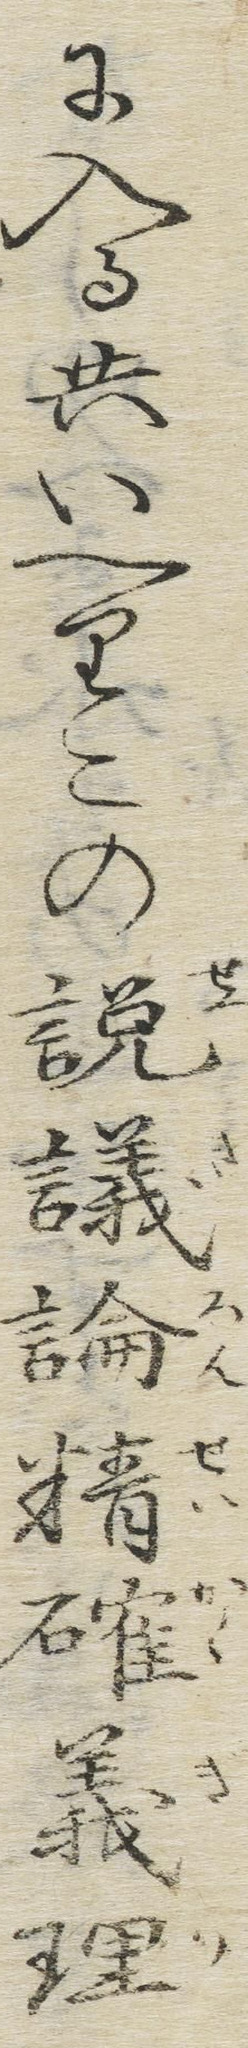に入る共いへりこの説議論精確義理
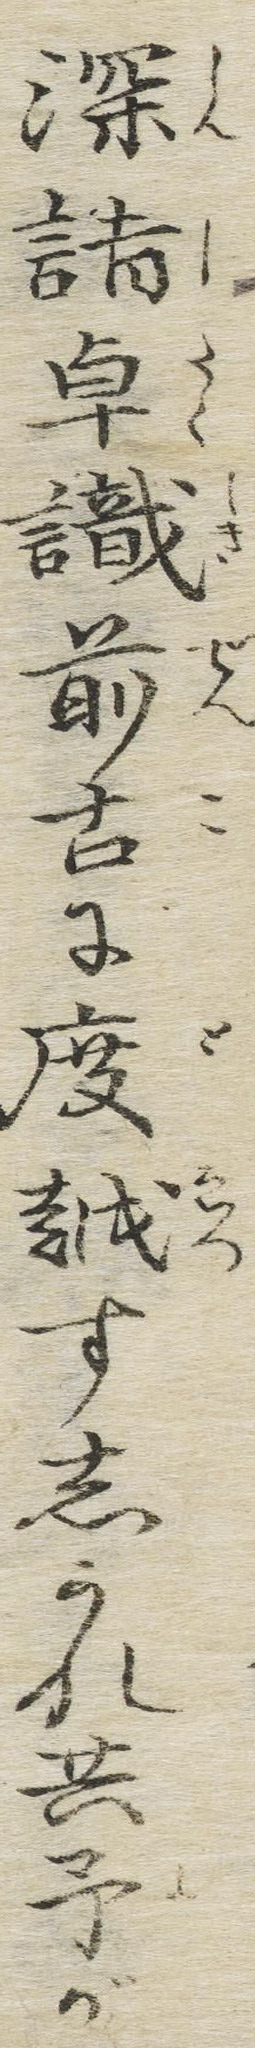深詣卓識前古に度越すしかれ共予が
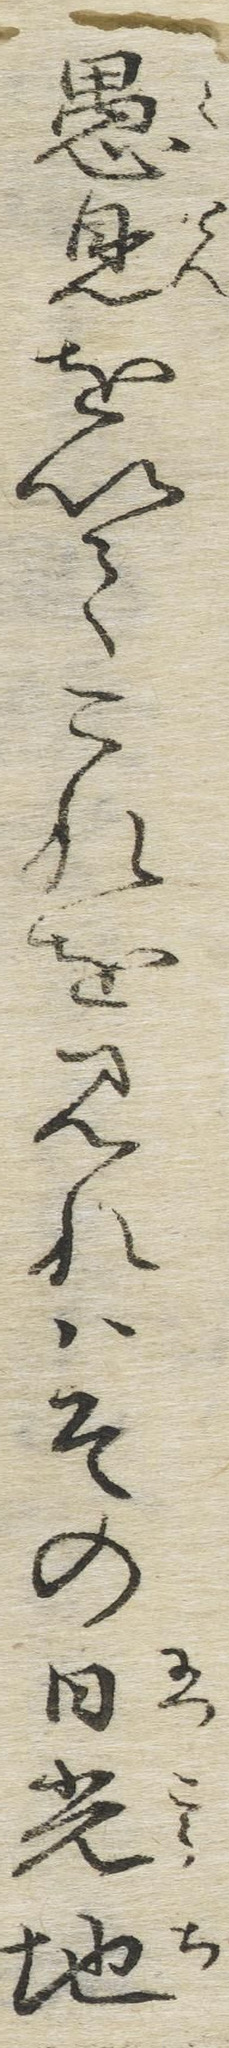愚見を以てこれを見れはその日光地

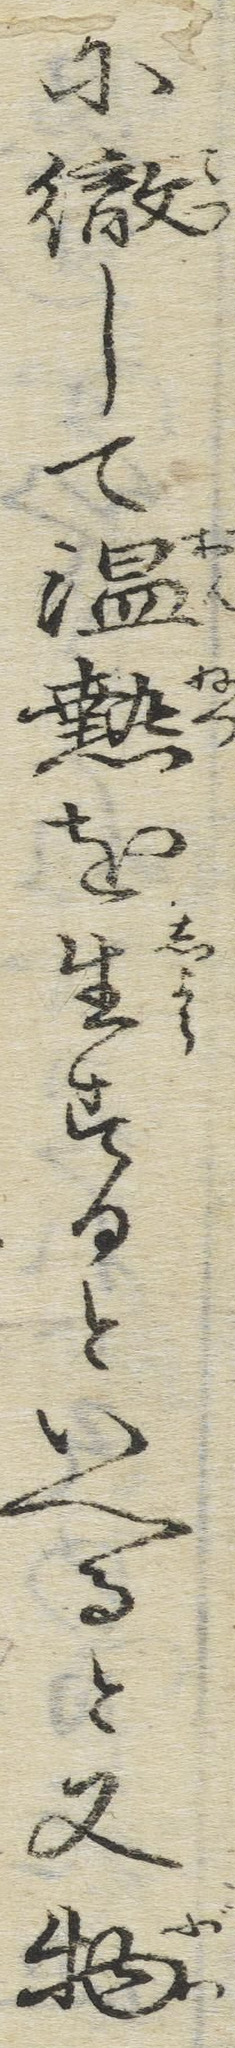に徹して温熱を生するといへると又物
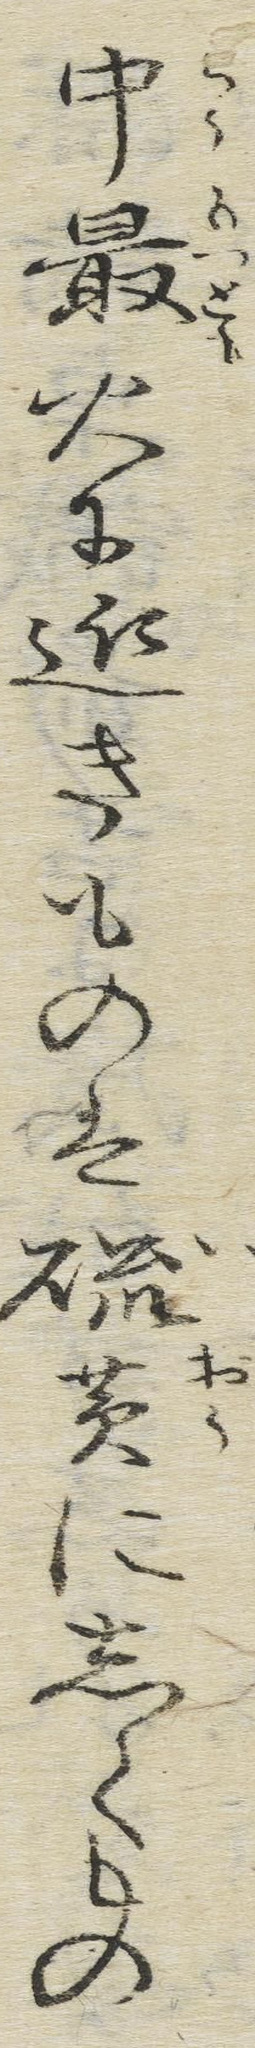中最火に近きものは硫黄にしくもの
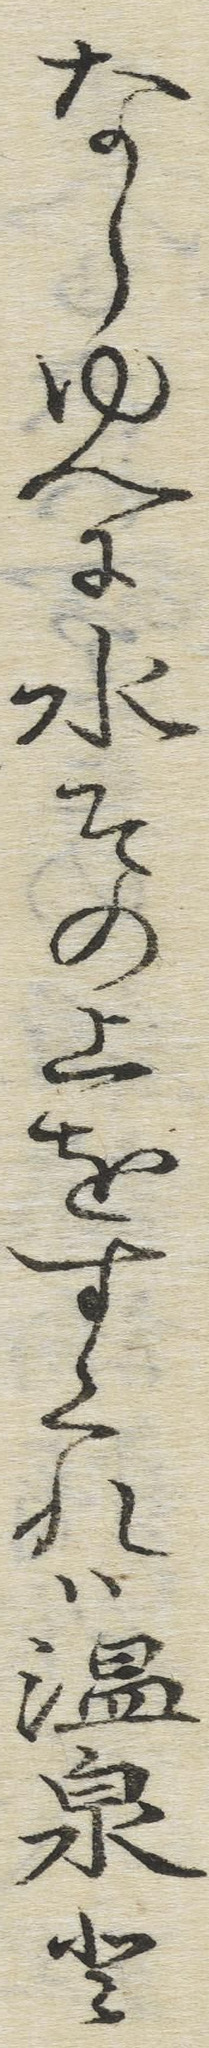なしゆへに水その上をすくれは温泉と
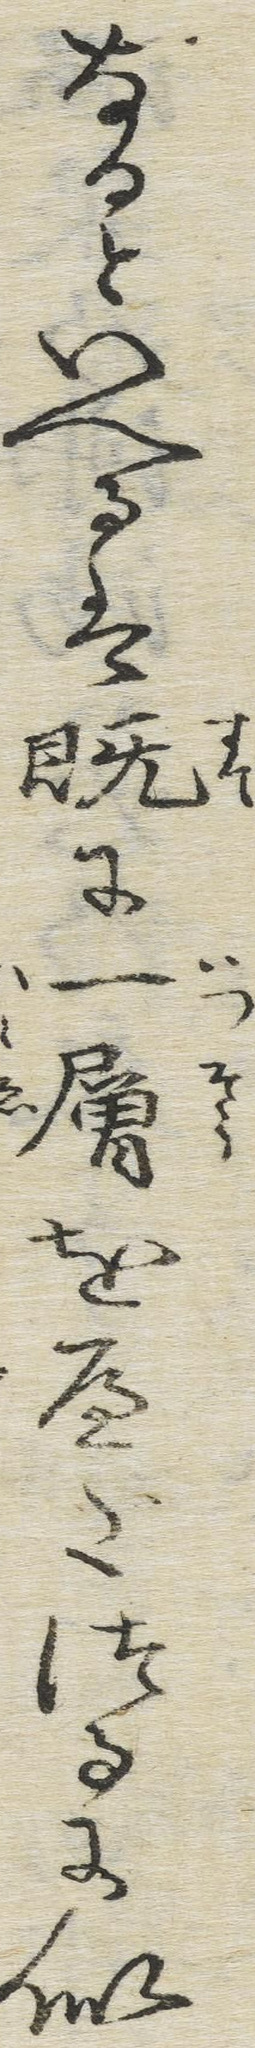なるといへるは既に一層をへだつるに似
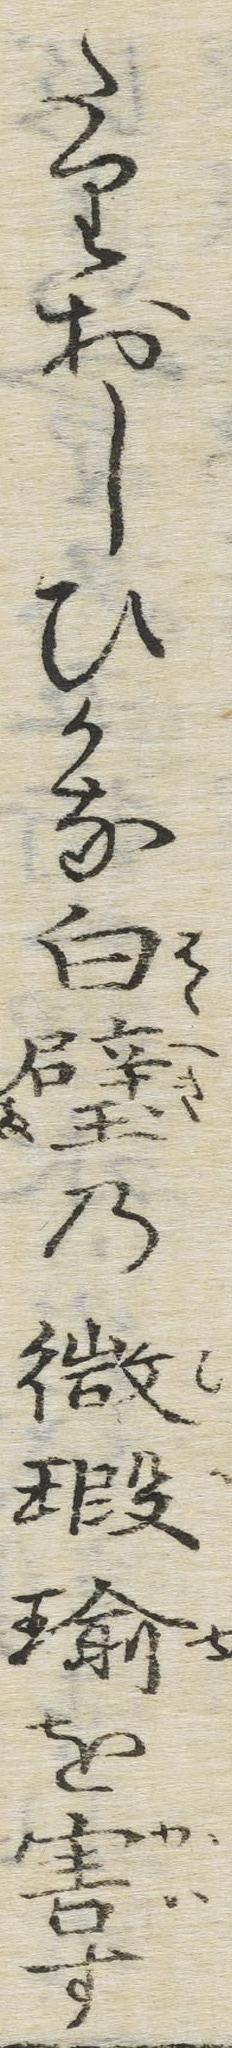たりおしひかな白璧の微瑕瑜を害す
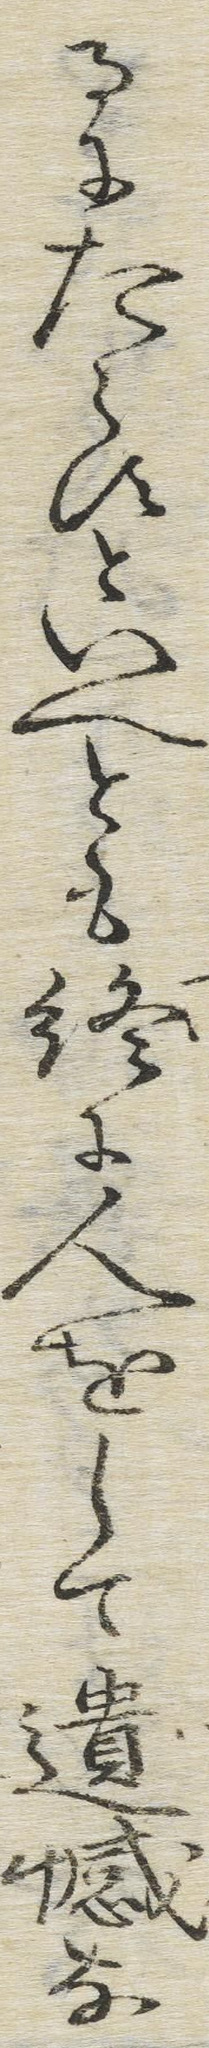るにたらすといへとも終に人をして遺憾な
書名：温泉考
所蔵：東京大学地震研究所図書室 Earthquake Research Institute Library, The University of Tokyo, JAPAN
